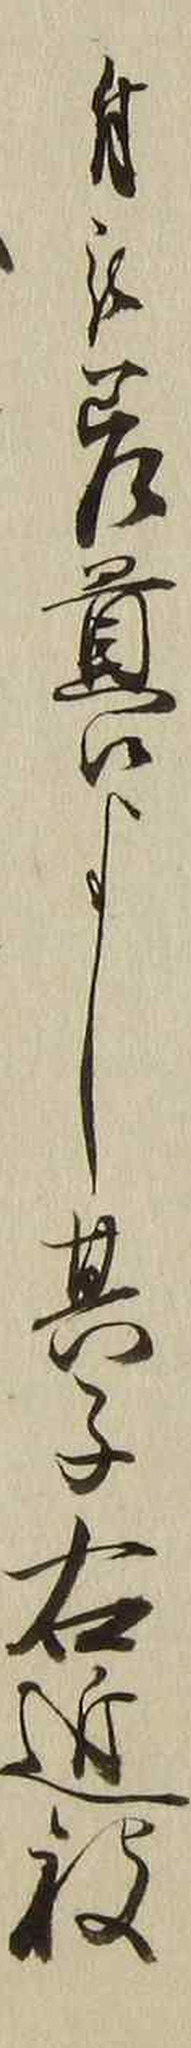付被差置候よし其子右近被
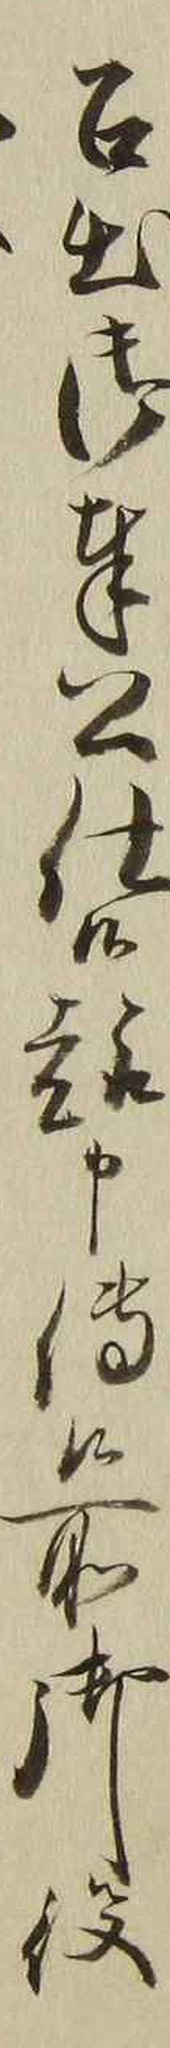召出御奉公仕候趣申伝候所御役
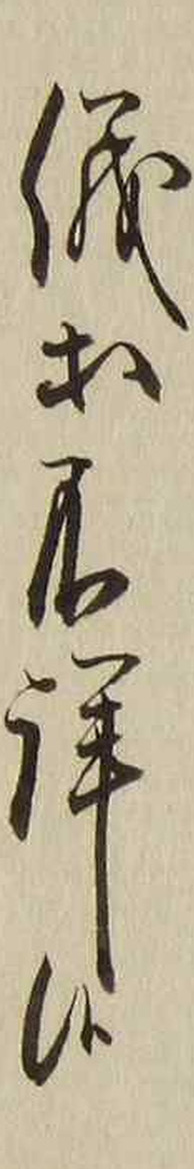儀等不詳候

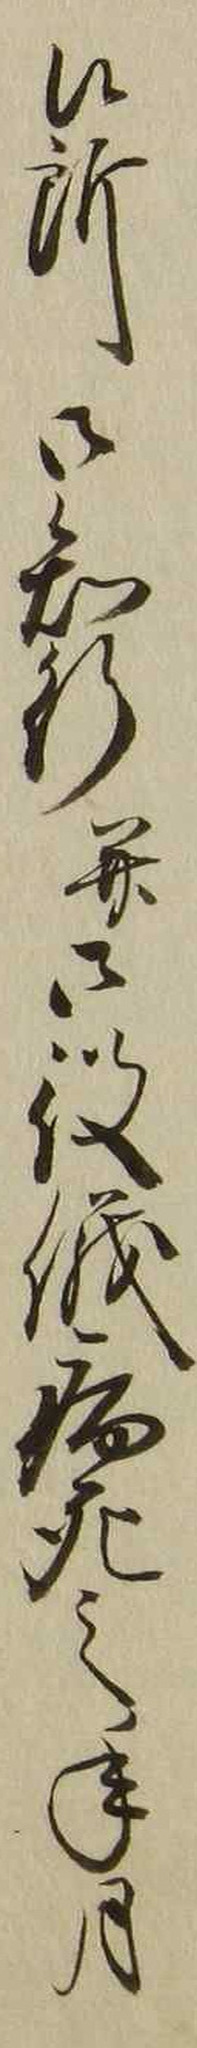候所御知行并御役儀病死之年月
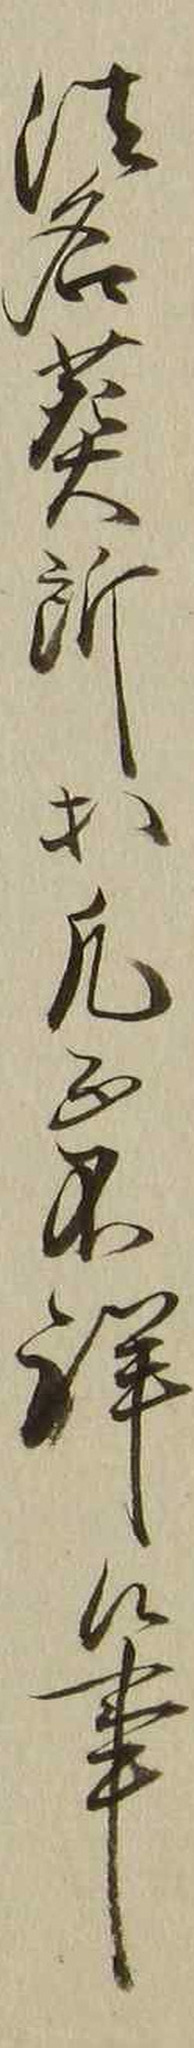法名葬所等凡而不詳候事
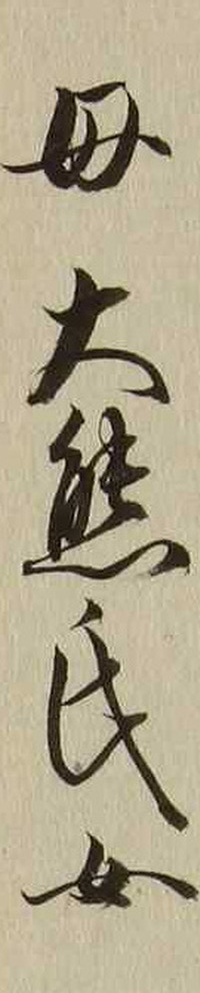母大熊氏女
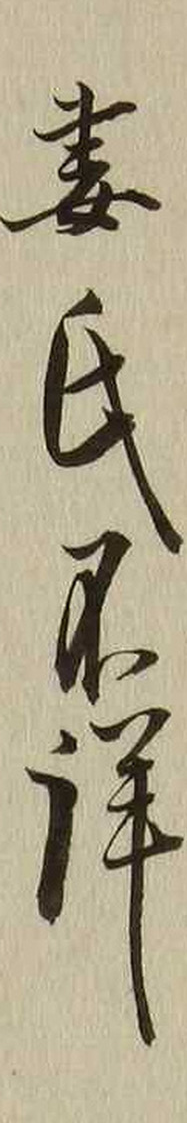妻氏不詳
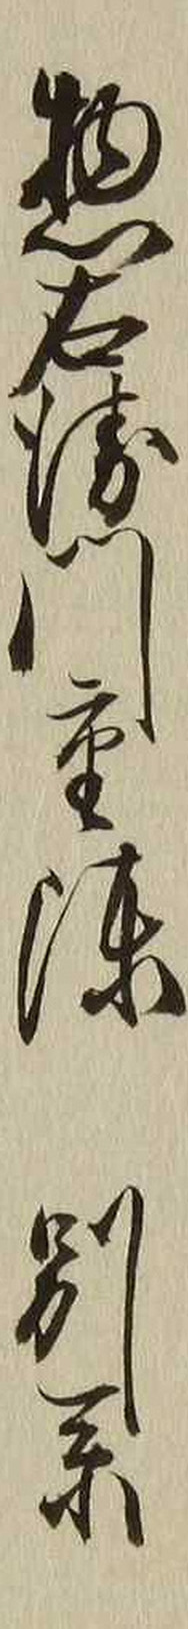惣右衛門重陣別系
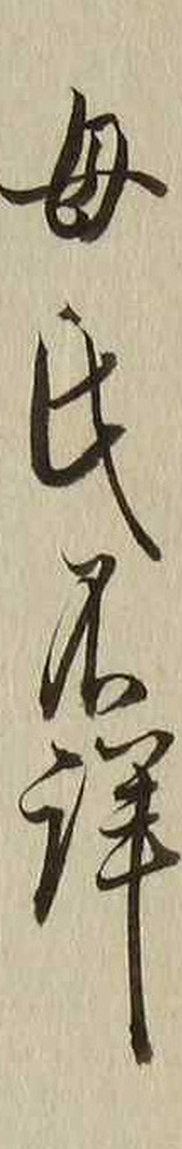母氏不詳
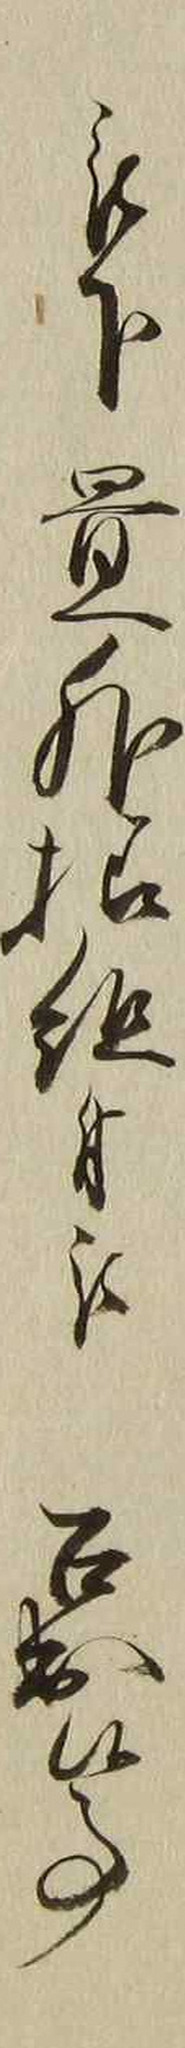被下置外様組付被召出候事
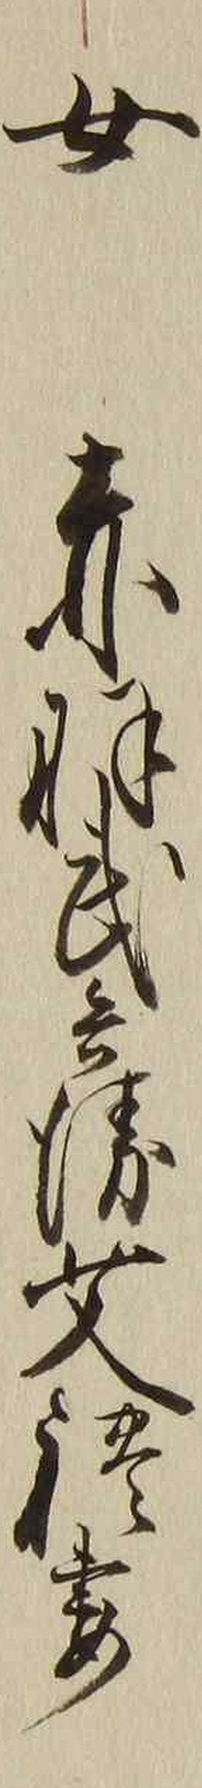女赤羽武兵衛艾礼妻
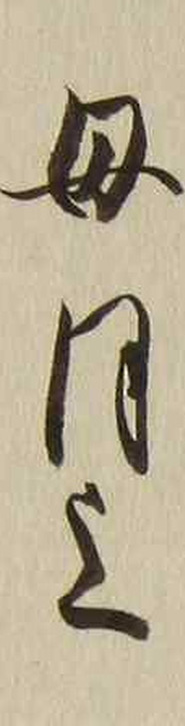母同上

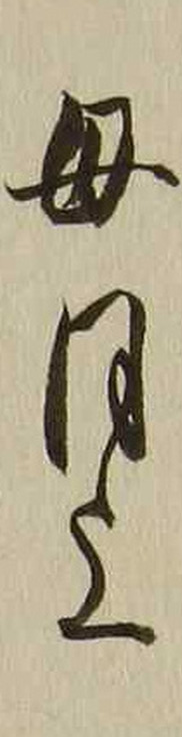母同上
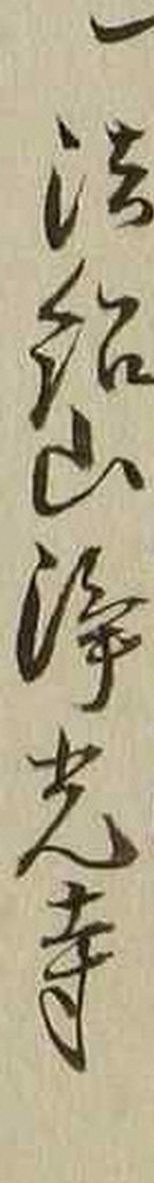法招山浄光寺
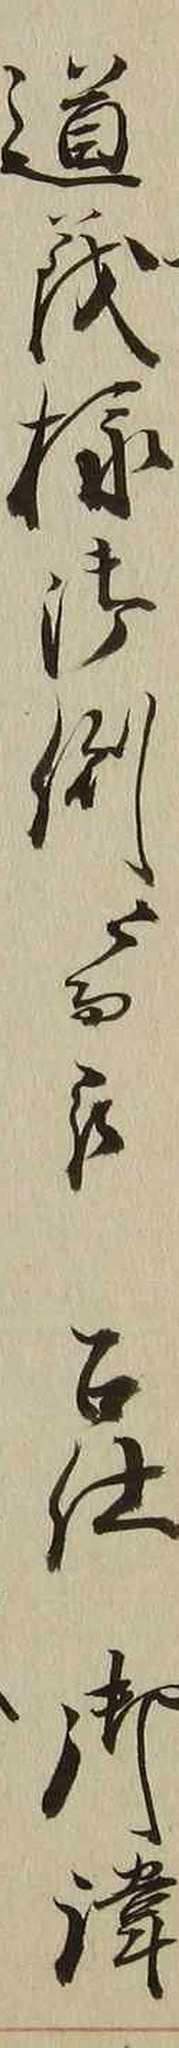道儀様御側に而被召仕御諱
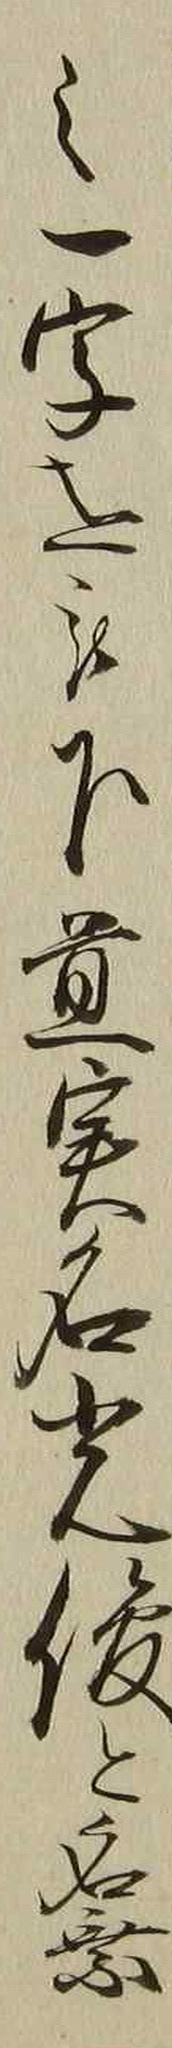之一字を被下置実名光俊と名乗
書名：諸士系譜　巻之77　を之部11
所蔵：会津若松市立会津図書館
